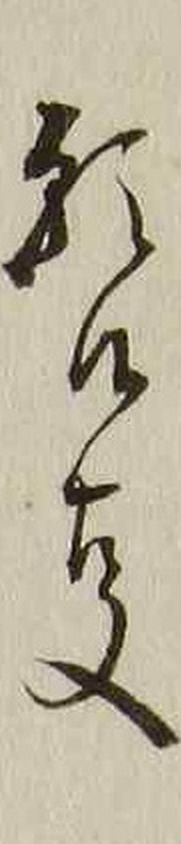願候事
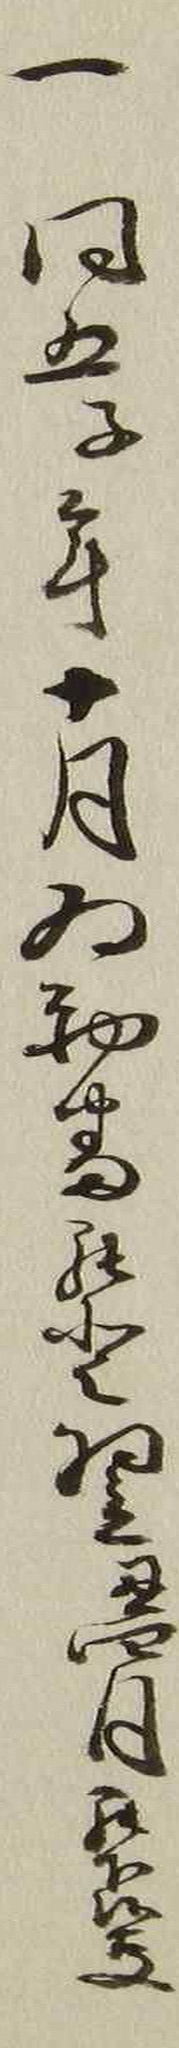一同五子年十月為勤番罷登翌丑四月罷下候事
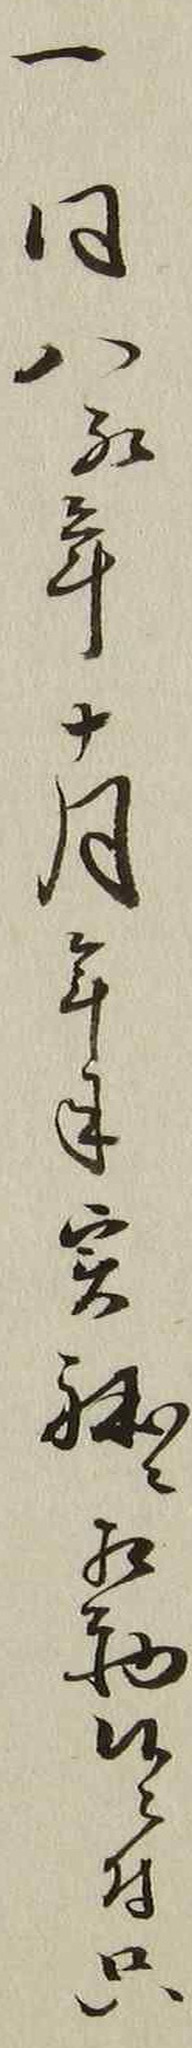一同八卯年十月年来実体ニ相勤候ニ付只
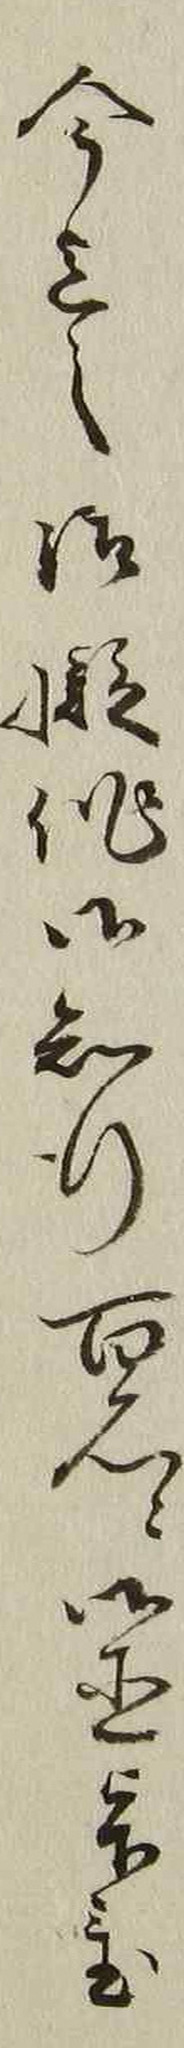今迄之御擬作御知行百石ニ御直被下置
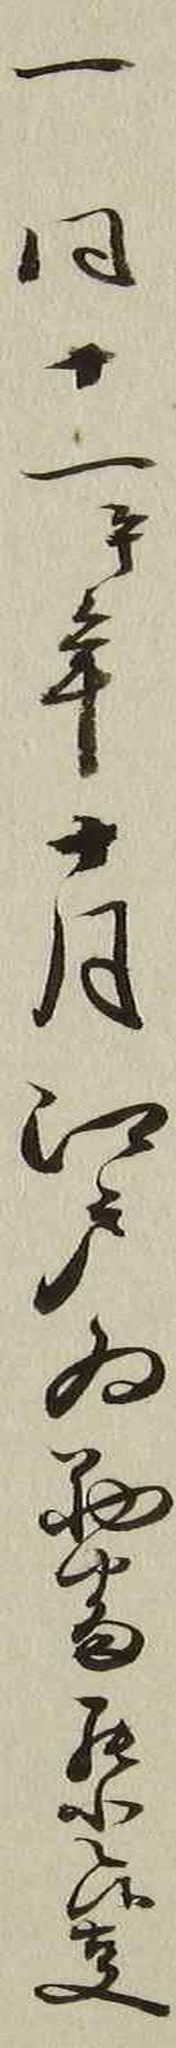一同十一午年十月江戸為勤番罷登候事
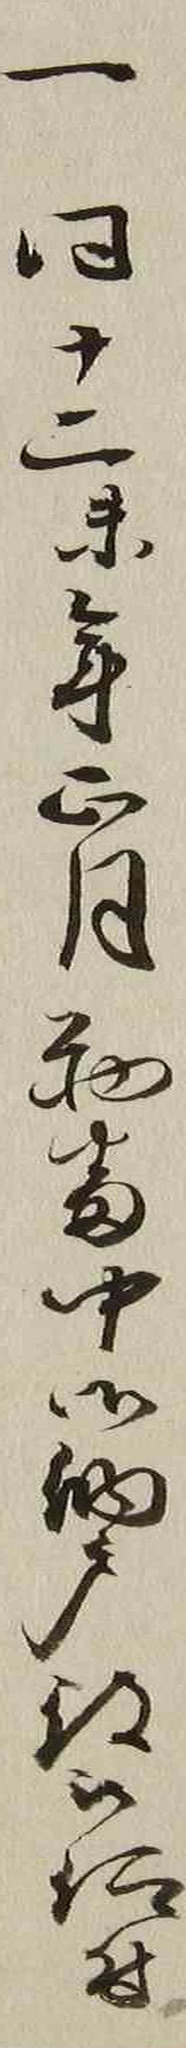一同十二未年正月勤番中御納戸役被仰付
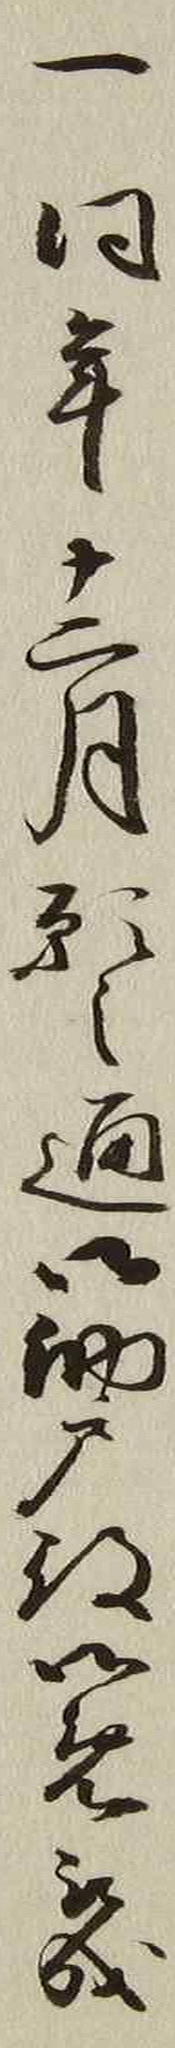一同年十二月願之通御納戸役御免被成
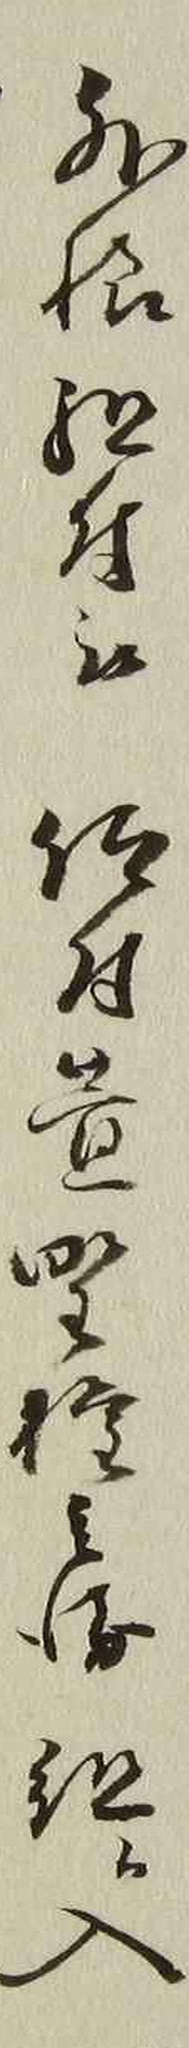外様組付被仰付萱野権兵衛組江入
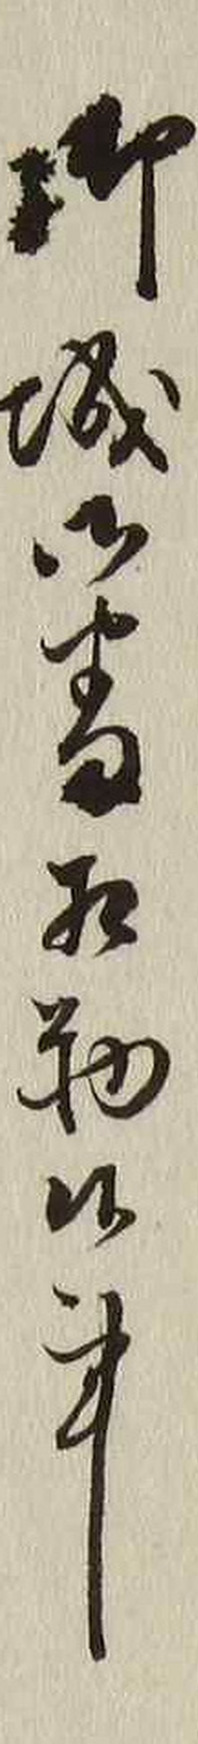御城御番相勤候事
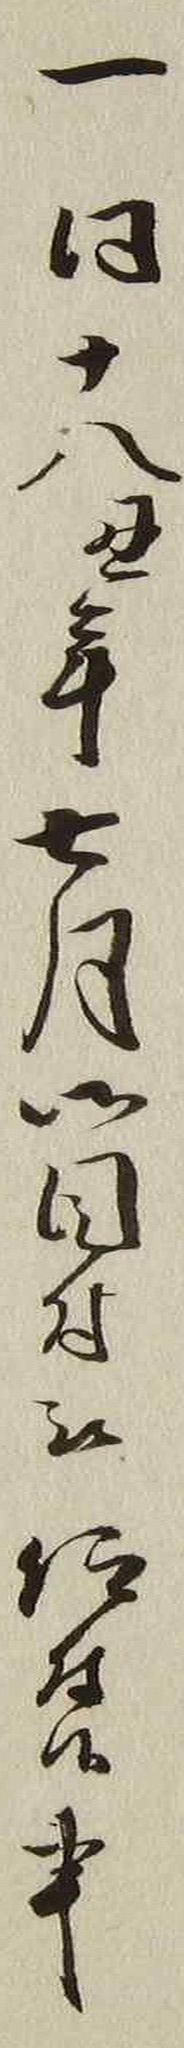一同十八丑年七月御目付被仰付候事
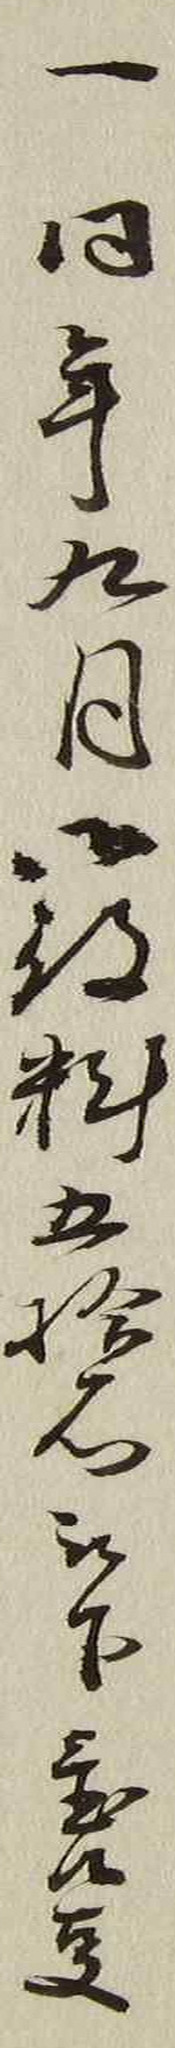一同年九月御役料五拾石被下置候事
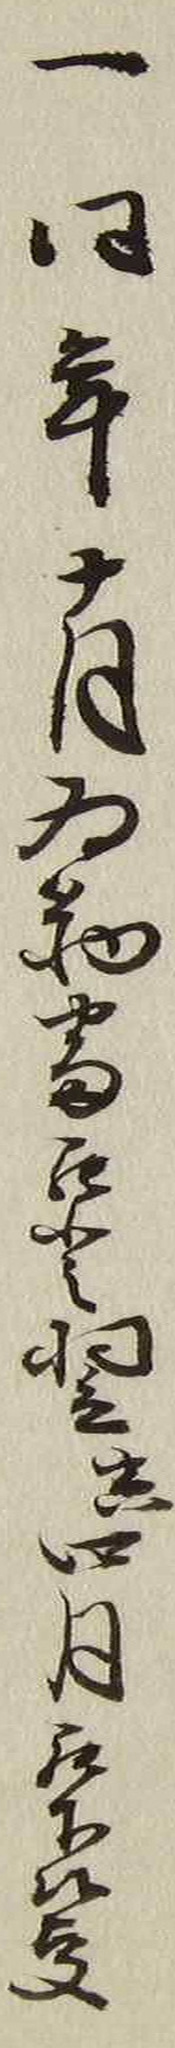一同年十月為勤番罷登翌寅四月罷下候事
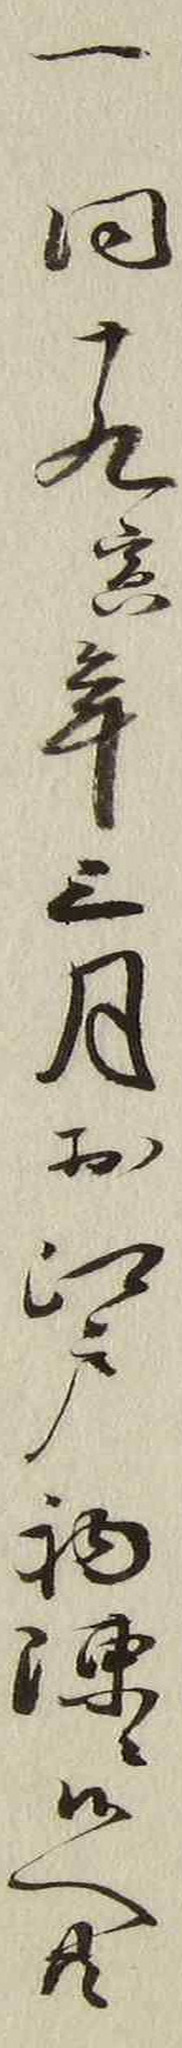一同十九寅年三月於江戸初陣ニ候へ共
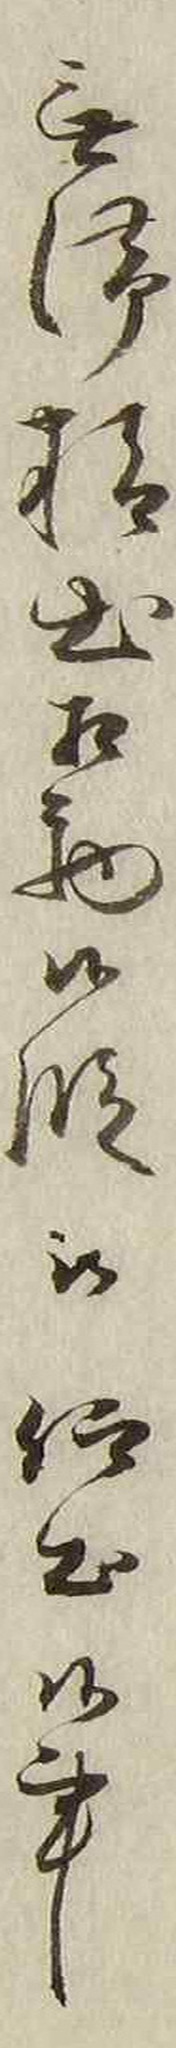無滞精出相勤候段被仰出候事
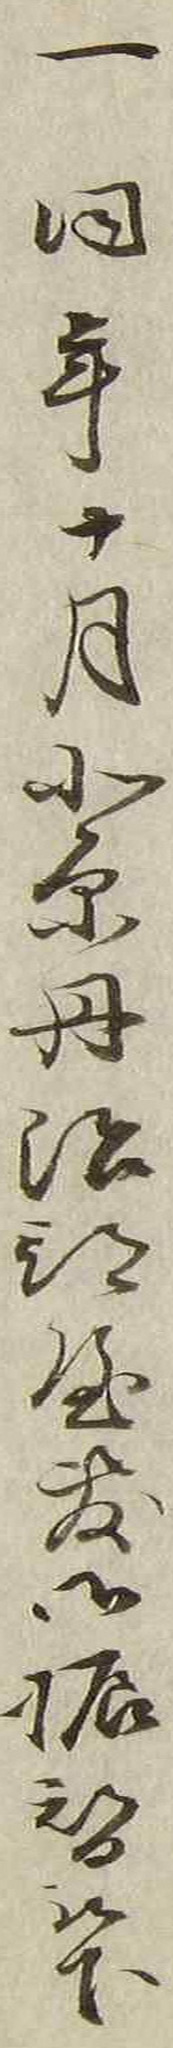一同年十月北原丹治跡屋敷御振替被下

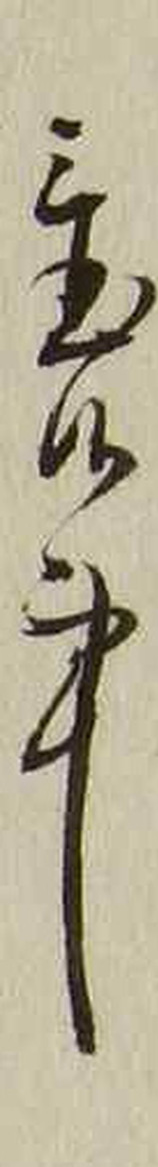置候事
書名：諸士系譜　巻之26　い之部26
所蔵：会津若松市立会津図書館
